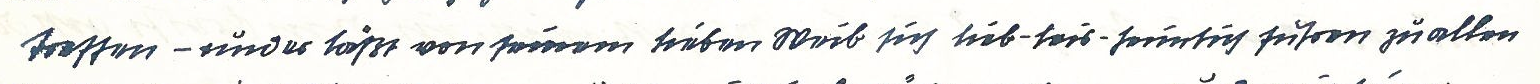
treffen – und er läßt von seinem lieben Weib sich lieb – leis – heimlich führen zu allen
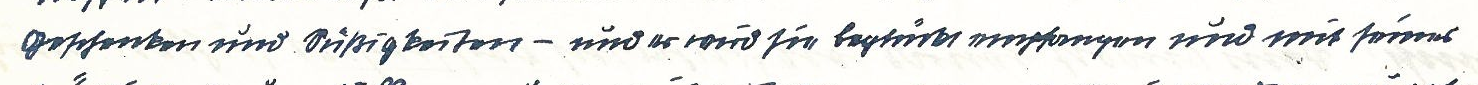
Gedanken und Süßigkeiten – und er wird sie beglückt empfangen und mit seiner
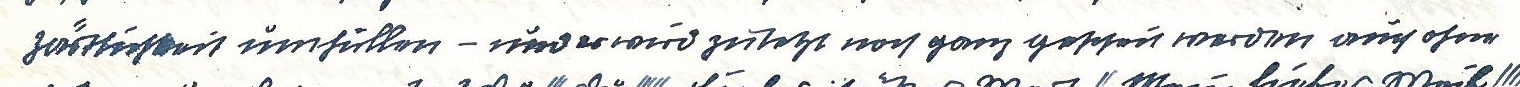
Zärtlichkeit umhüllen – und er wird zuletzt noch ganz gescheit werden auch ohne
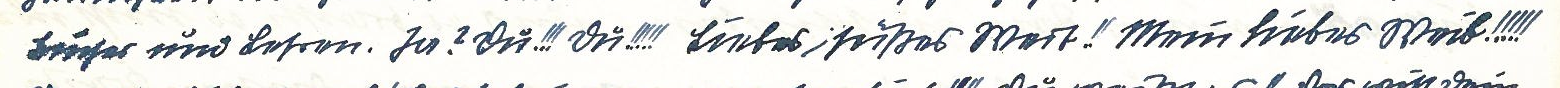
Bücher und Lehren. Ja? Du!!! Du!!!!! Liebes, süßes Weib. Mein liebes Weib!!!!!
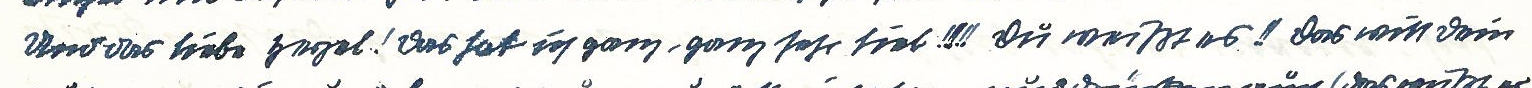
Und das liebe Herzel! Das hab ich ganz, ganz sehr lieb!!!!! Du weißt es!! Das will Dein
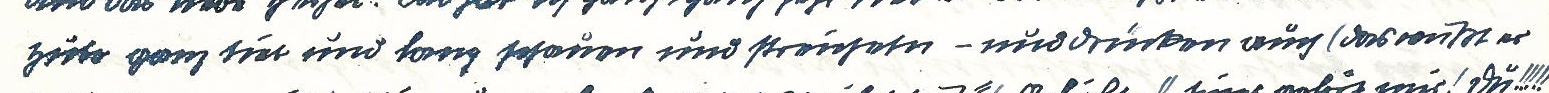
Hubo ganz lieb und lang schauen und streicheln – und drücken auch (das wußt er
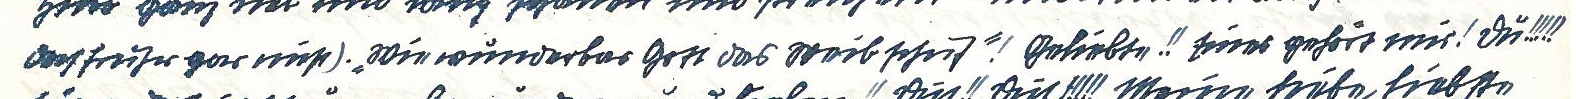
doch früher gar nicht). „Wie wunderbar Gott das Weib schuf“! Geliebte!! Eines gehört mir! Du!!!!!
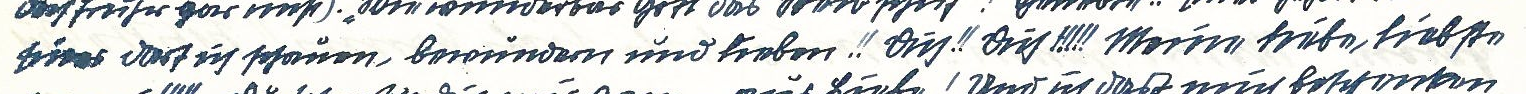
Eines darf ich schauen, bewundern und lieben!! Dich!! Dich!!!!! Meine liebe, liebste
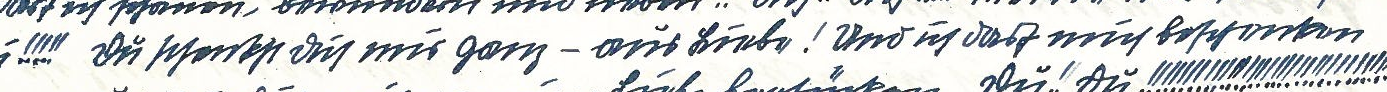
!!!!! Du schenkst Dich mir ganz – aus Liebe! Und ich darf mich beschenken
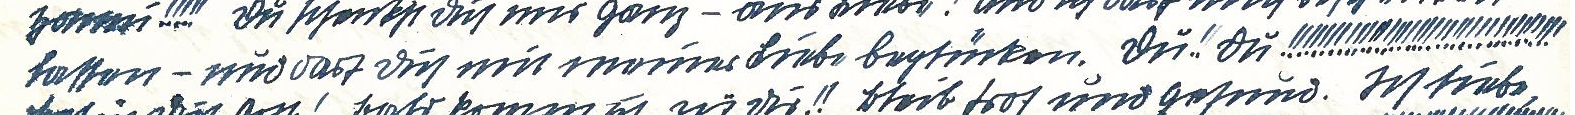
lassen – und darf Dich mit meiner Liebe beglücken. Du! Du!!!!!!!!!!!!!!!!!!!!!!!!!!!!!!!!!!!
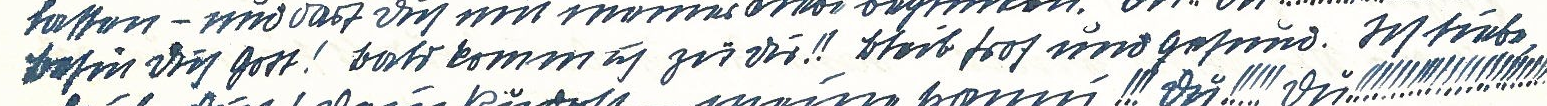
Behüt Dich Gott! Bald komm ich zu Dir!! Bleib froh und gesund. Ich liebe,
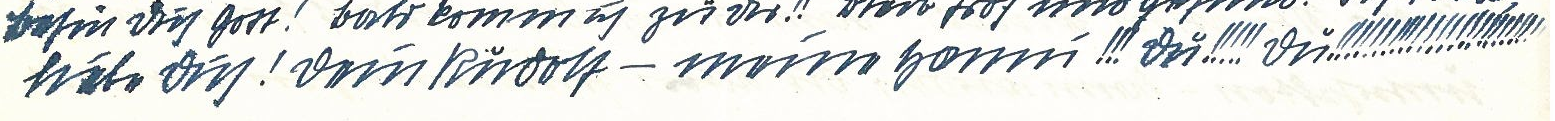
liebe Dich! Dein – meine !!! Du!!!!! Du!!!!!!!!!!!!!!!!!!!!!!!
